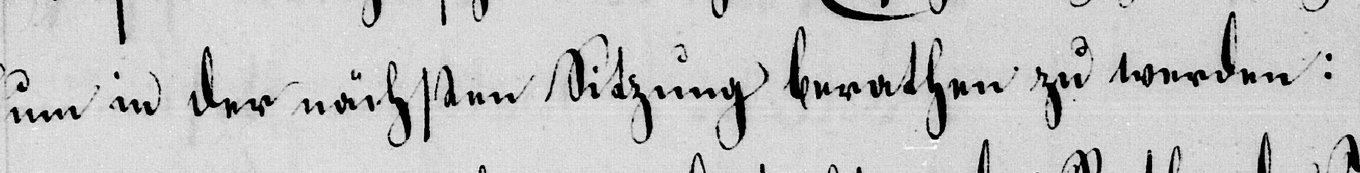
um in der nächsten Sitzung berathen zu werden:
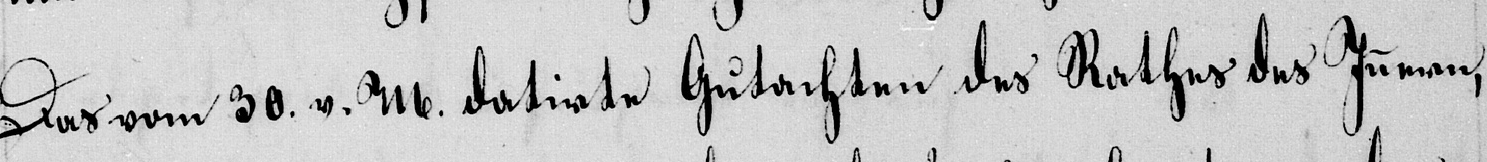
Das vom 30. v. M. datirte Gutachten des Rathes des Innern,
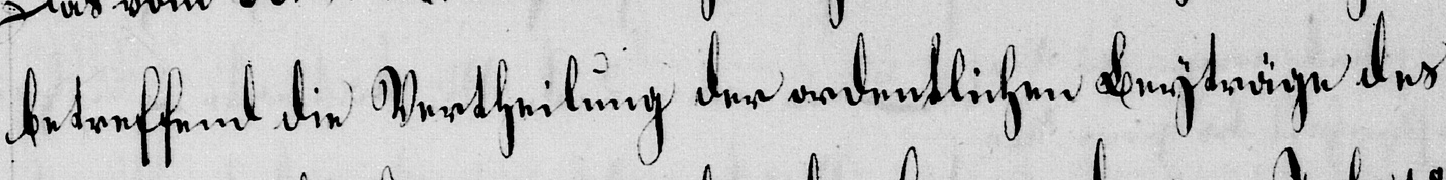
betreffend die Vertheilung der ordentlichen Beyträge des
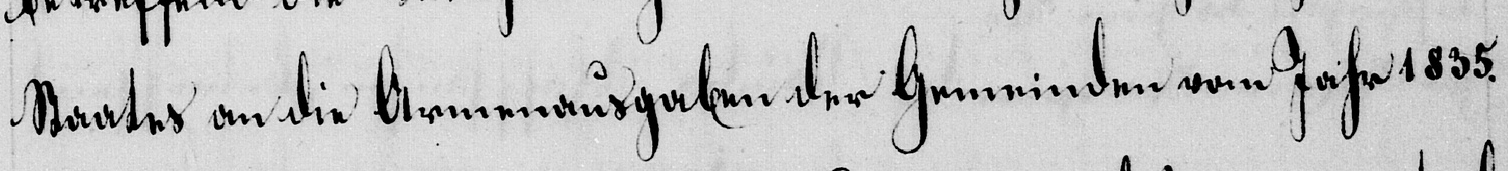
Staates an die Armenausgaben der Gemeinden vom Jahr 1835.
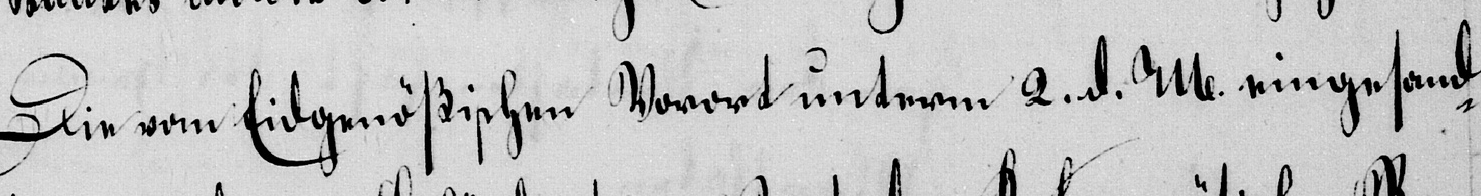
Die vom Eidgenößischen Vorort unterm 2. d. M. eingesand¬
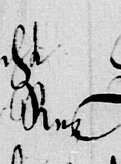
Des
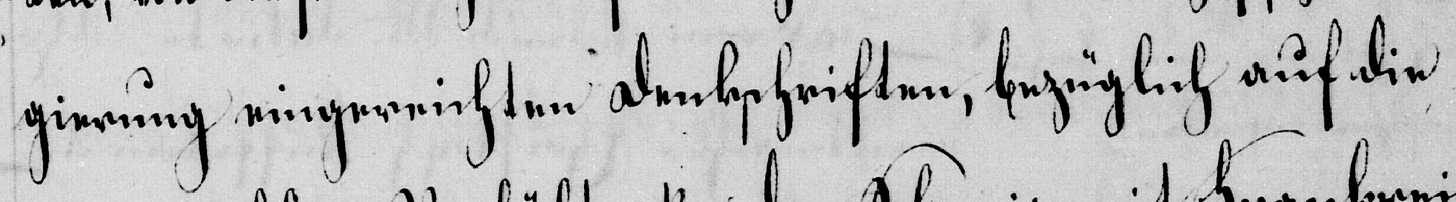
gierung eingereichten Denkschriften, bezüglich auf die
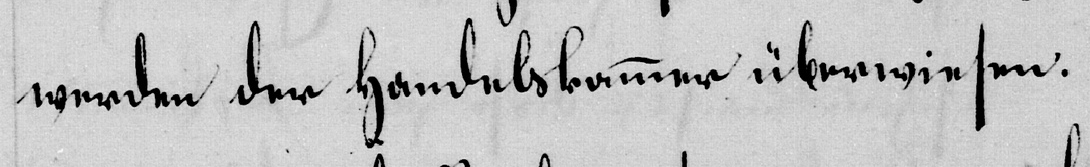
werden der Handelskammer überwiesen.
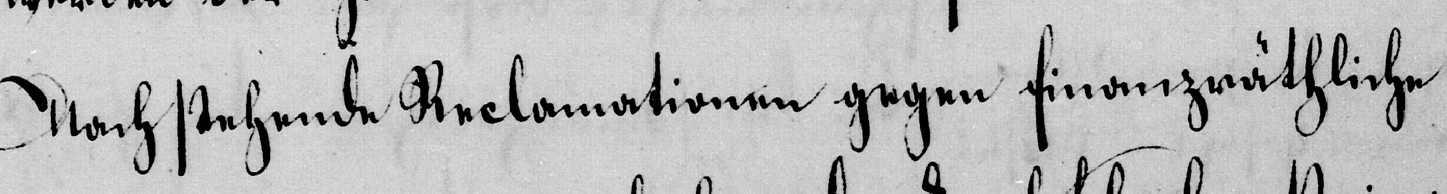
Nachstehende Reclamationen gegen finanzräthliche
